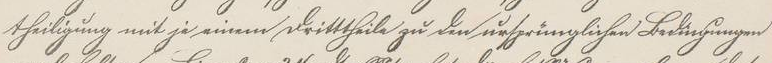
theiligung mit je einem Dritttheile zu den ursprünglichen Bedingungen
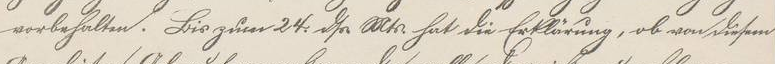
vorbehalten. Bis zum 24. dss. Mts. hat die Erklärung, ob von diesem
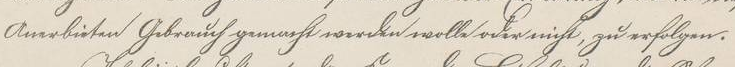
Anerbieten Gebrauch gemacht werden wolle oder nicht, zu erfolgen.
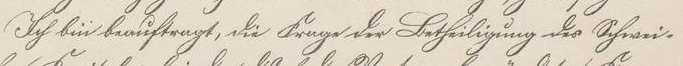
Ich bin beauftragt, die Frage der Betheiligung des Schwei-
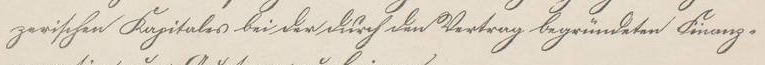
zerischen Kapitales bei der durch den Vertrag begründeten Finanz-
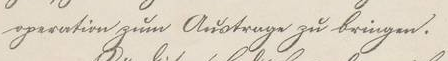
operation zum Austrage zu bringen.
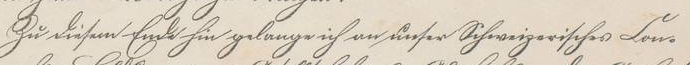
Zu diesem Ende hin gelange ich an unser Schweizerisches Con-
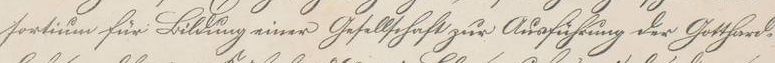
sortium für Bildung einer Gesellschaft zur Ausführung der Gotthard -
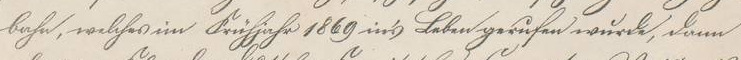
bahn, welches im Frühjahr 1869 in's Leben gerufen wurde, dann
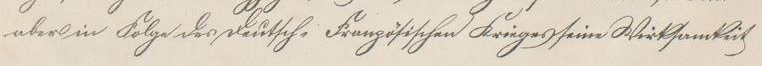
aber in Folge des Deutsch-Französischen Krieges seine Wirksamkeit
